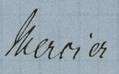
Bericht
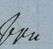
Mercier
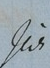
Ihnen
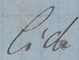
würde.
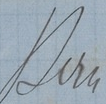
Die
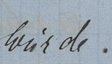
Herr v.
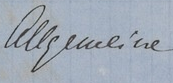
R. zu besorgen
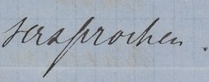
versprochen.
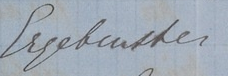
Ergebenster
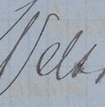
Welti
